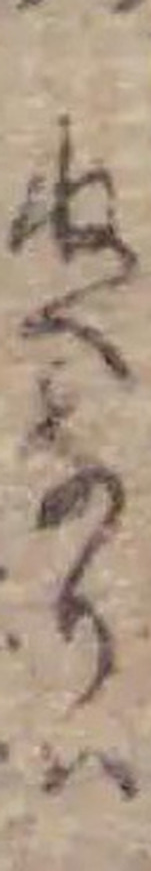ねへなりは
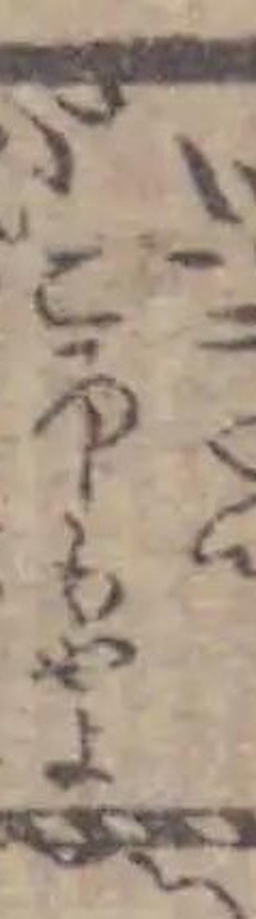ころしもやよ
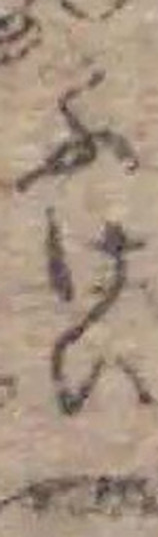ふけい
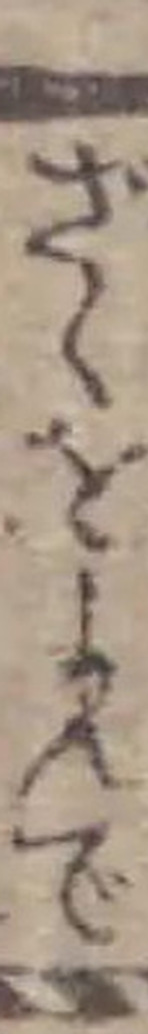ざくをよんで
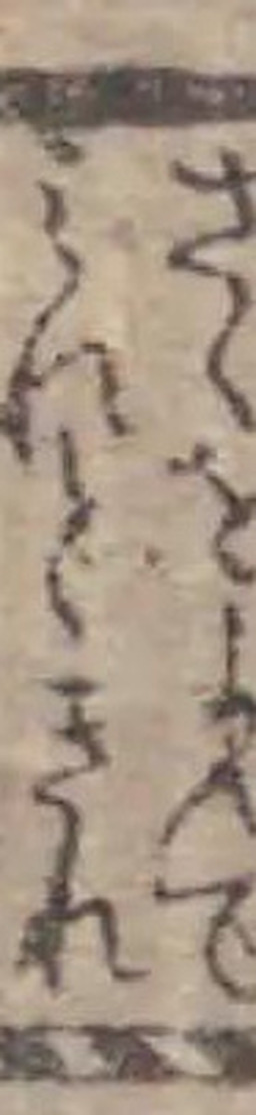みれどきれ
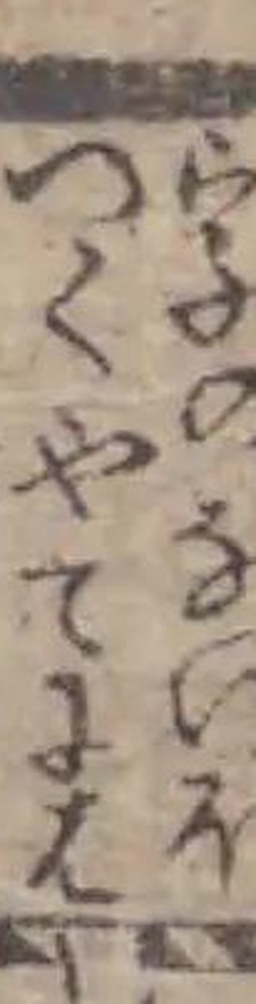つくやてには
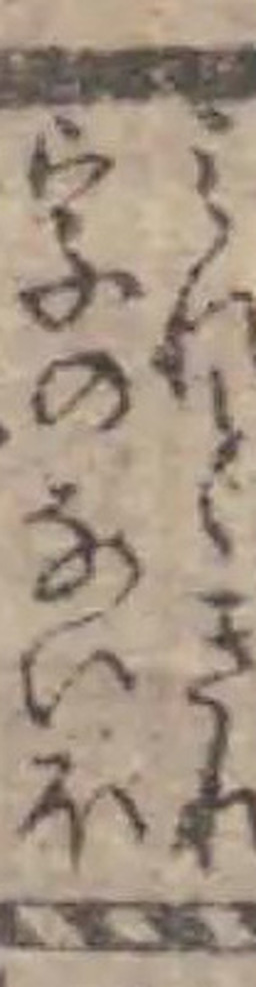字のないほ
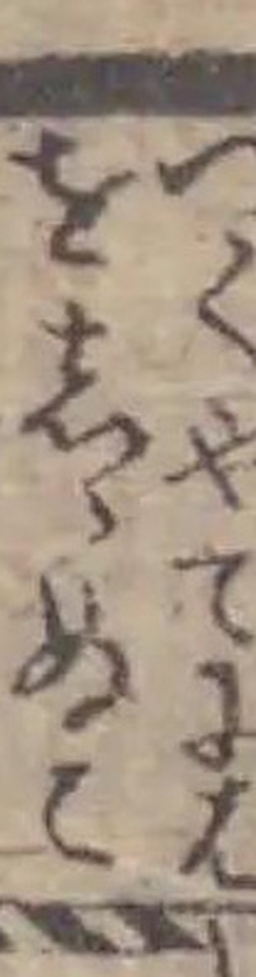をしらぬこ
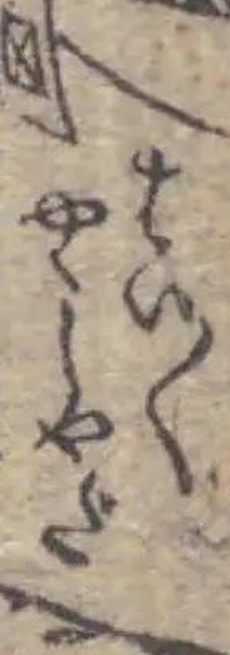やくしやだ
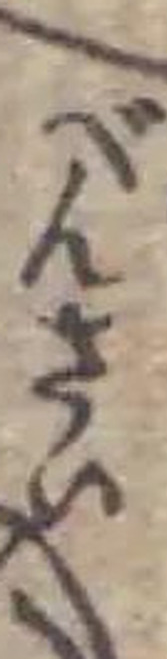べんさい
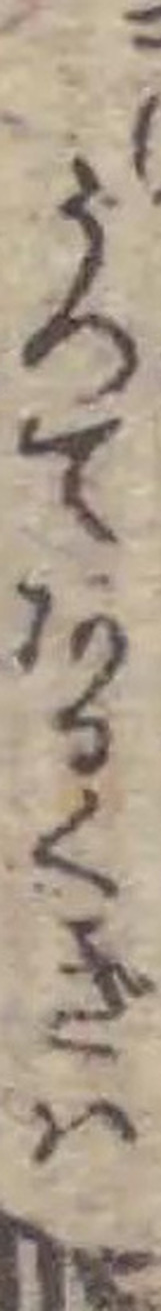うつてあるくぎは
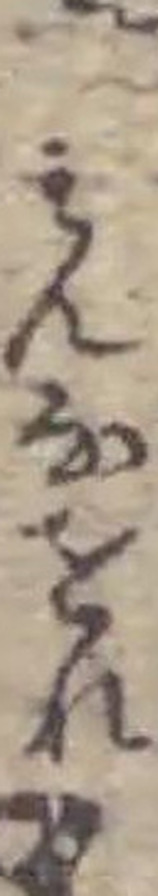みんなをれ
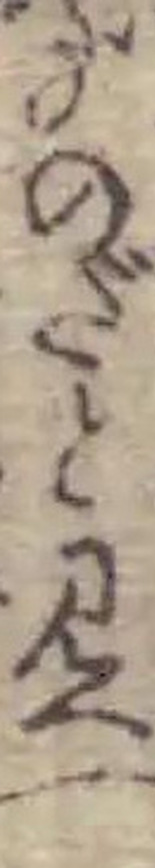のだと見へ
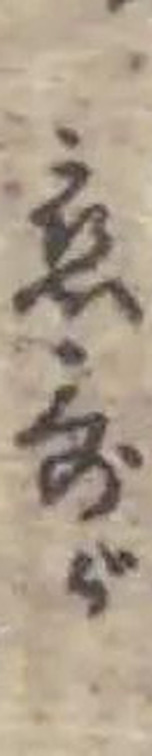恋歌が
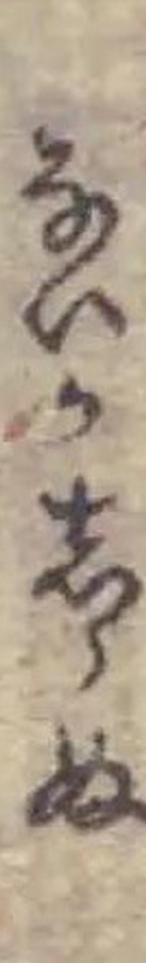ないかしらぬ

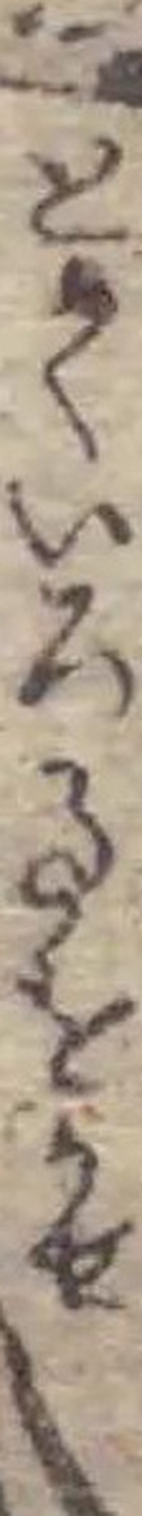とかくいろ事をかせ
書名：色男其処此処 3巻
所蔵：国立国会図書館 National Diet Library, JAPAN
